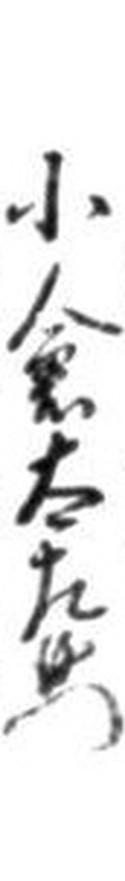小倉太左衛門
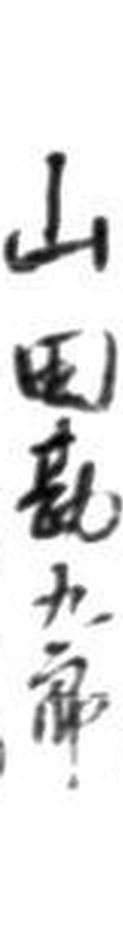山田勘九郎
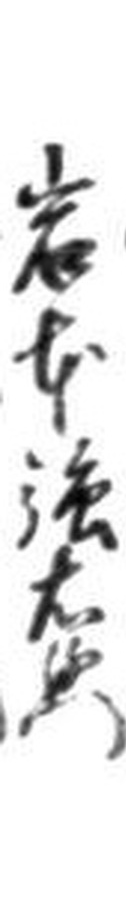岩本強右衛門
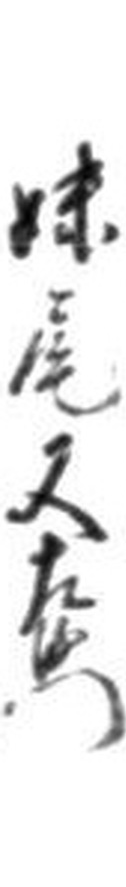妹尾又左衛門
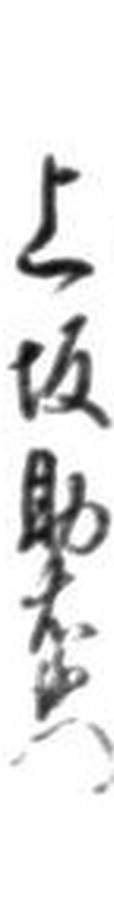上坂助右衛門
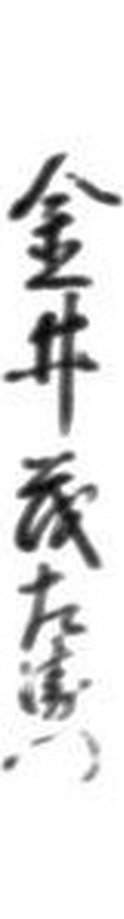金井茂左衛門
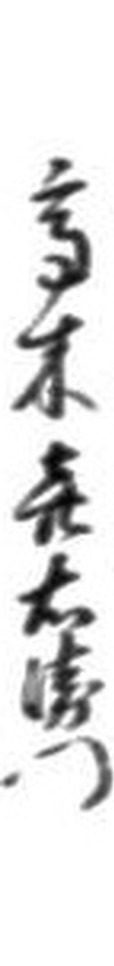高木喜右衛門
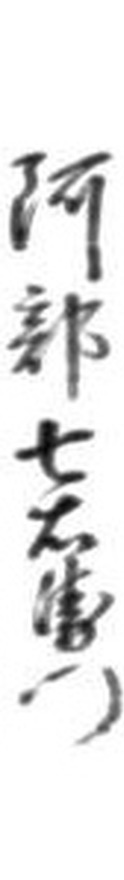阿部七右衛門
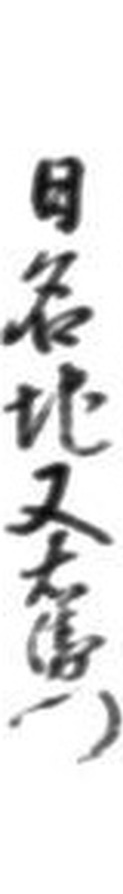日名地又右衛門
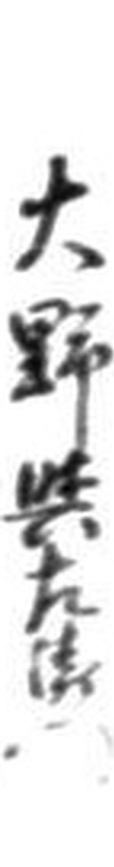大野与左衛門
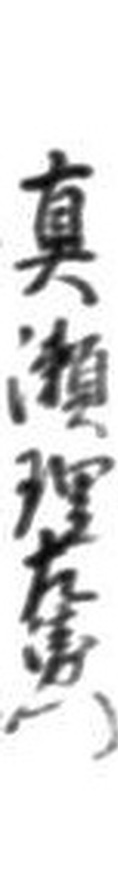真瀬理左衛門
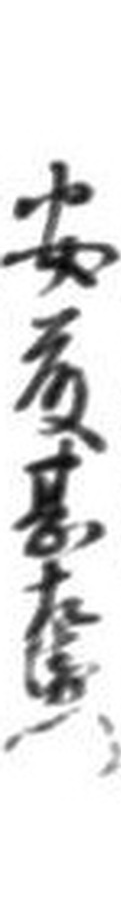安藤甚左衛門
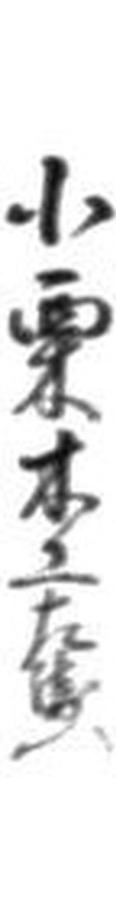小栗木工左衛門
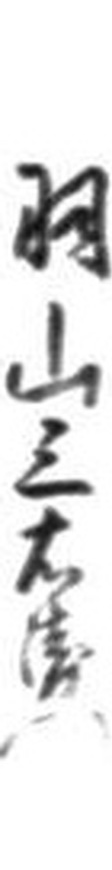羽山三右衛門
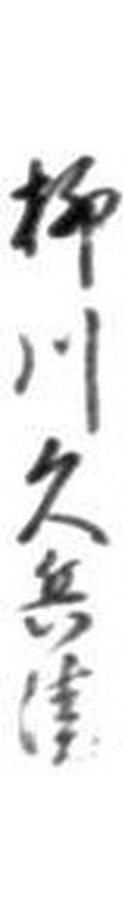柳川久兵衛
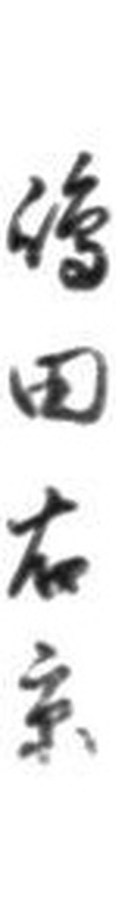嶋田右京
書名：家譜 二 忠直公 従文禄四年到慶安四年
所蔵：福井県文書館 Fukui Prefectural Archives
